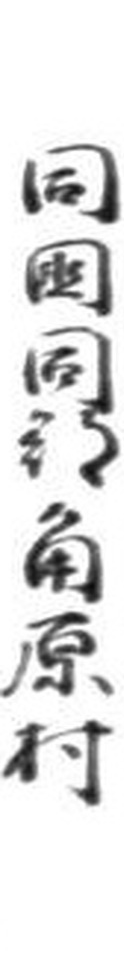同国同郡角原村

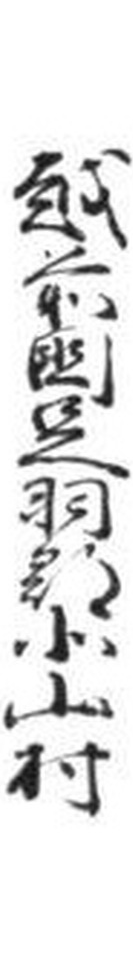越前国足羽郡北山村
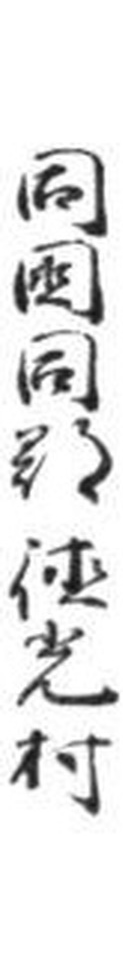同国同郡徳光村
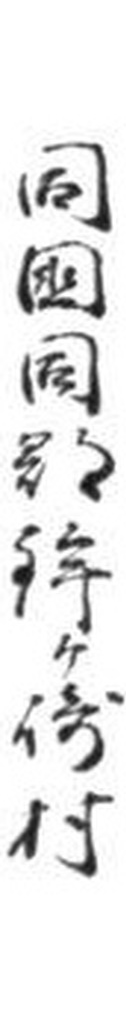同国同郡鉾ヶ崎村
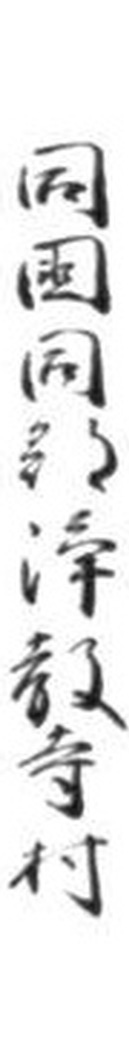同国同郡浄教寺村
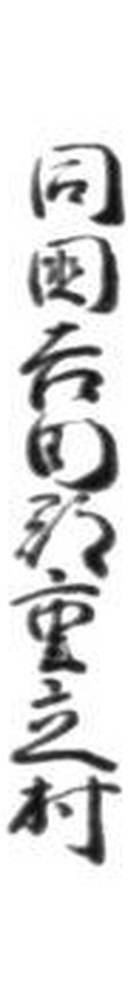同国吉田郡重立村
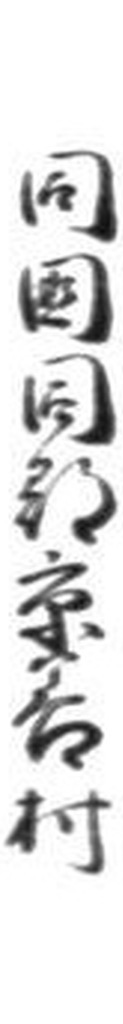同国同郡京善村
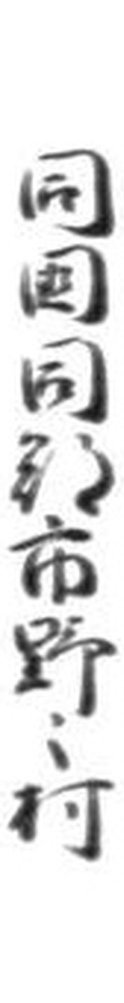同国同郡市野々村
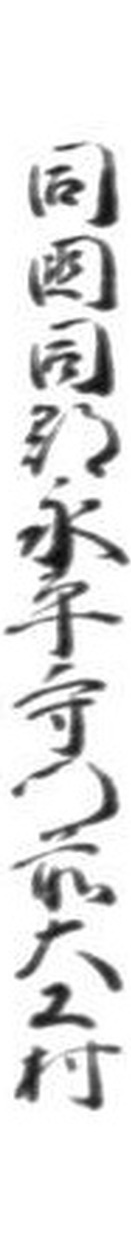同国同郡永平寺門前大工村

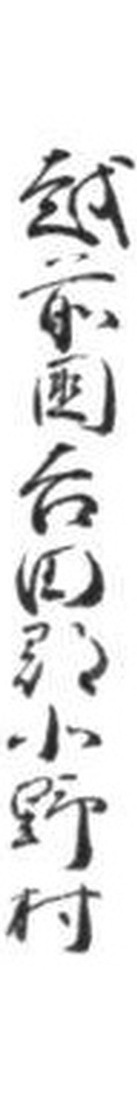越前国吉田郡小野村
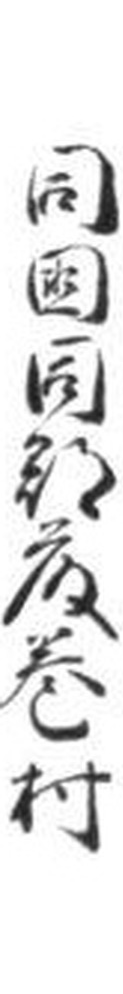同国同郡藤巻村
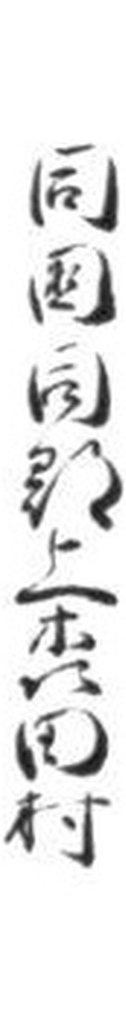同国同郡上森田村
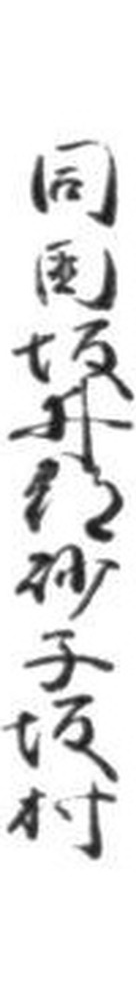同国坂井郡砂子坂村
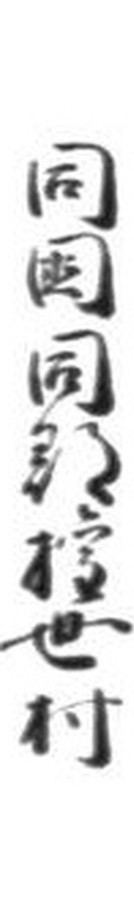同国同郡権世村
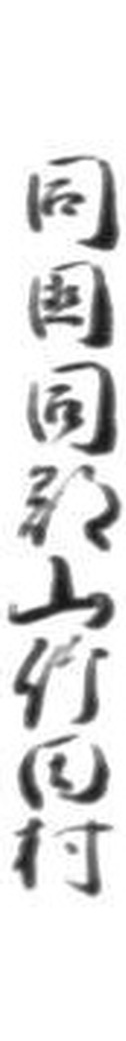同国同郡山竹田村
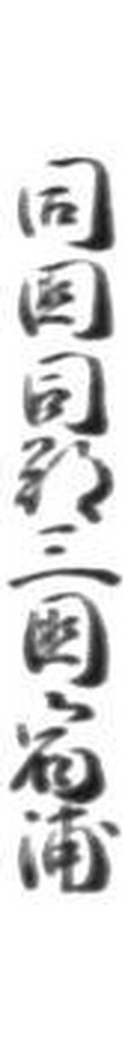同国同郡三国宿浦
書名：家譜 十七 吉品公 従元禄元年到同二年
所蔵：福井県文書館 Fukui Prefectural Archives
